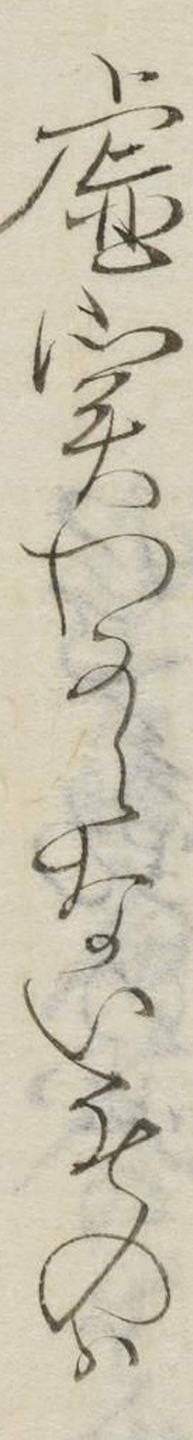虚実わからないものハ
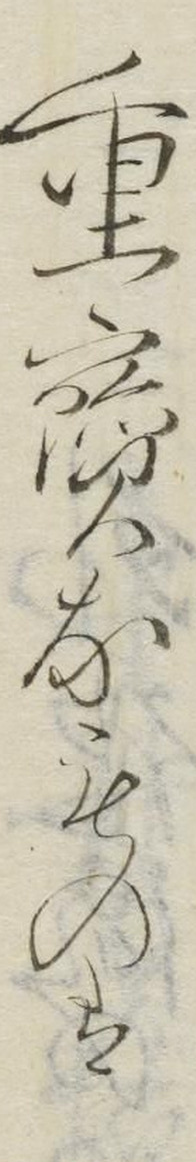重宝なものは
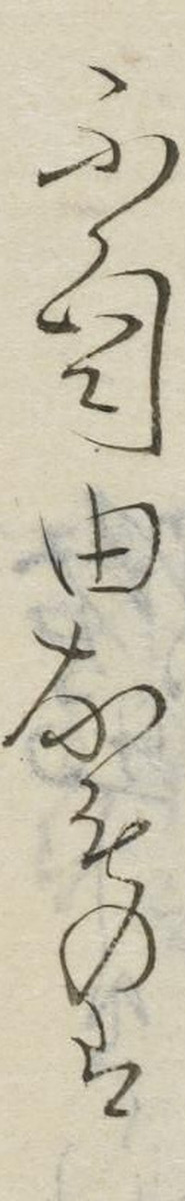不自由なものは
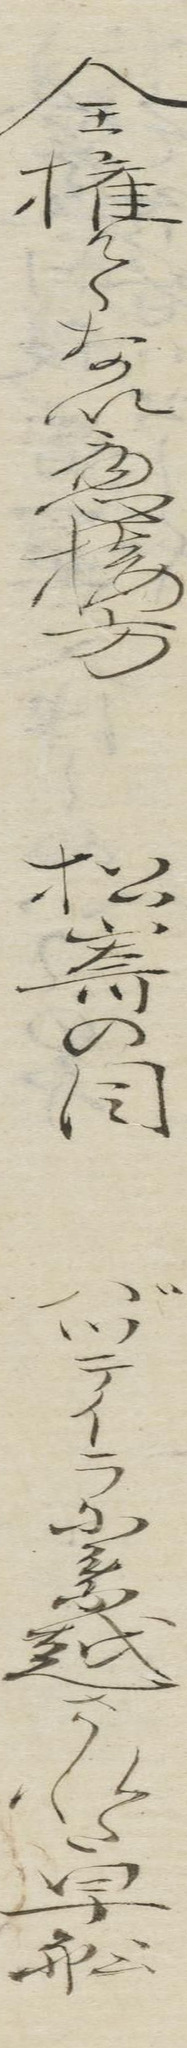全権のない応接方松㟢の目バツテイラに乗越された早船
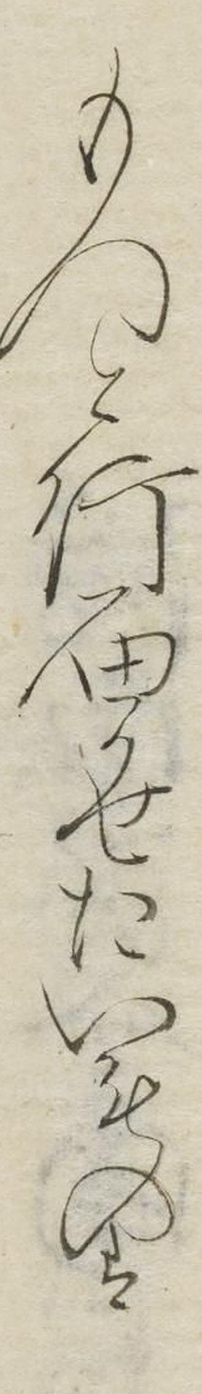もつと行届かせたいものは
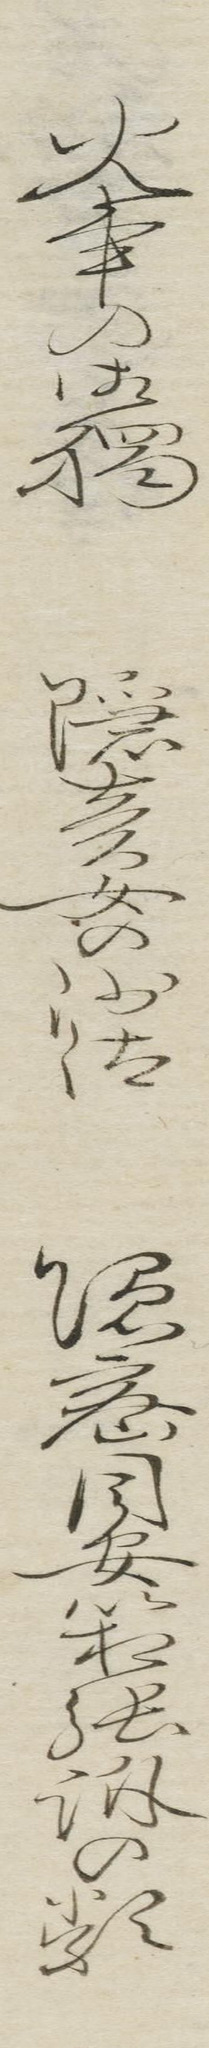火事の御触隠売女の沙汰隠密目安箱張訴の類
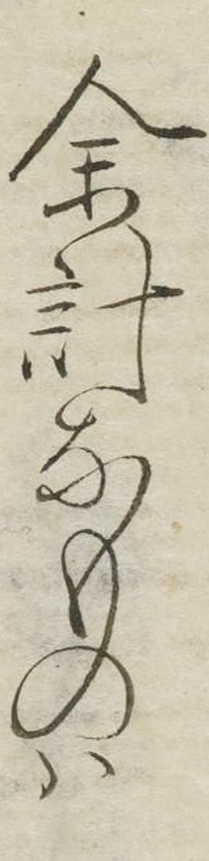余計なものは
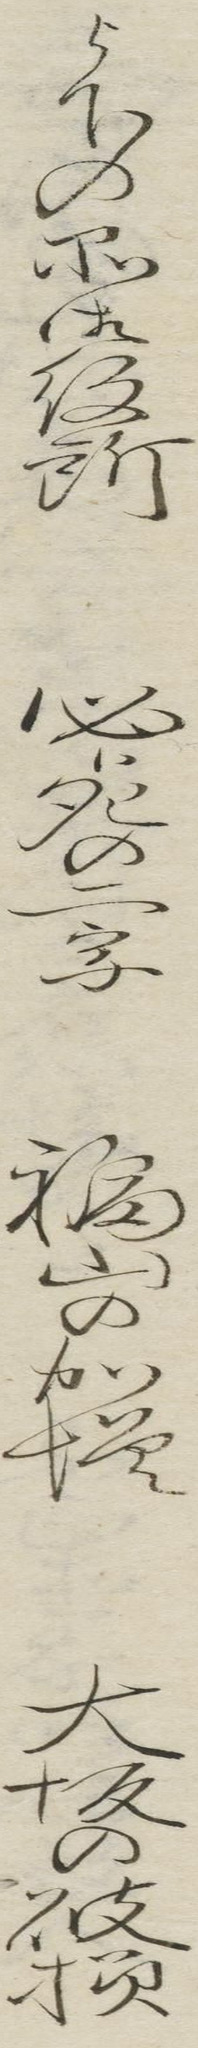被下の品お役所必死の二字福山の加増大坂の破損
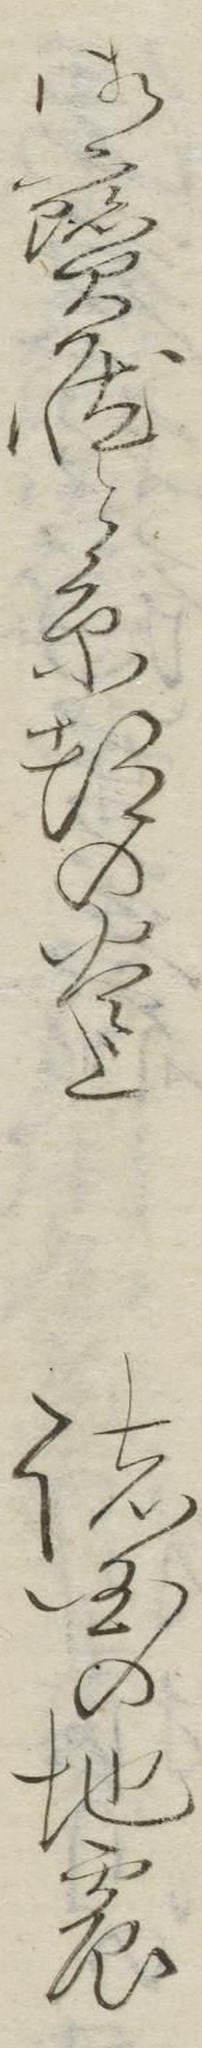御寶蔵と京都の炎上諸国の地震
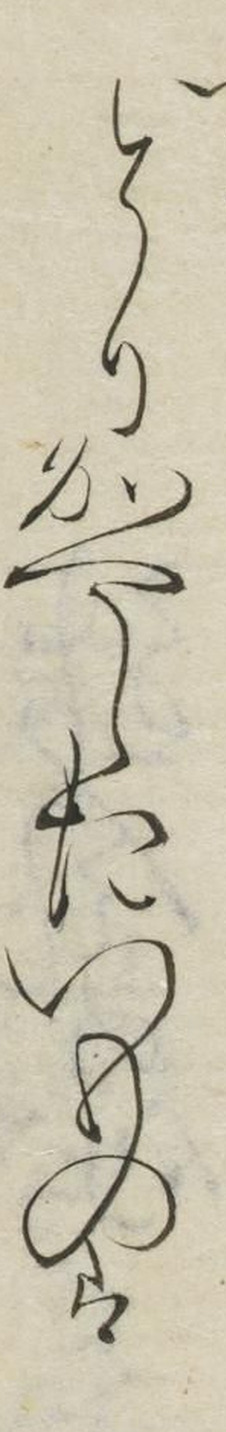とりかへしたいものは
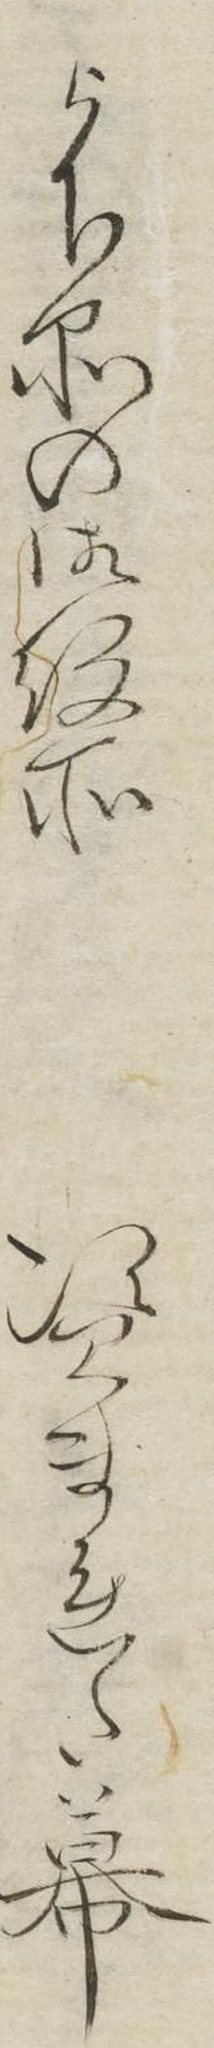被下の品お役所盗まれた幕
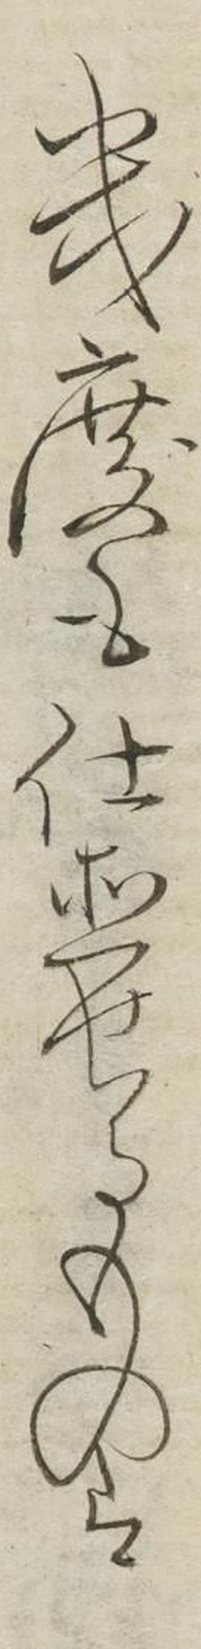幾度も仕直せるものは

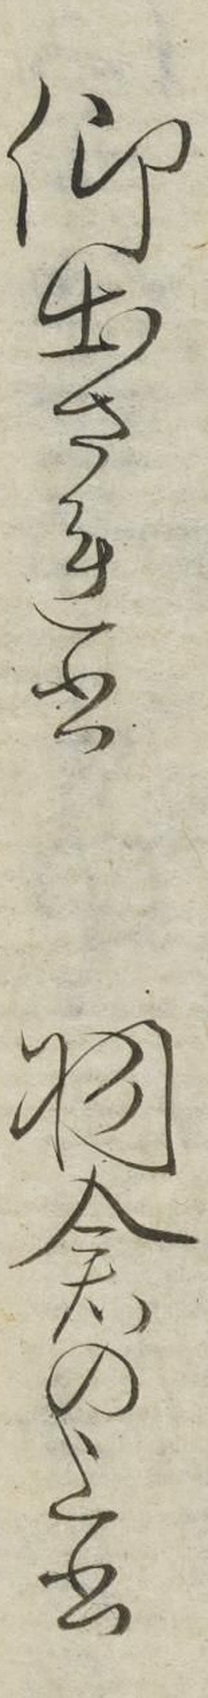仰出され書羽倉の上書
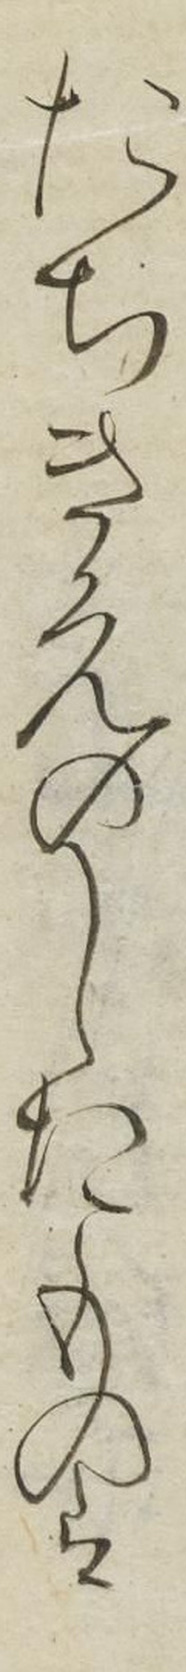たちきえのしたものは
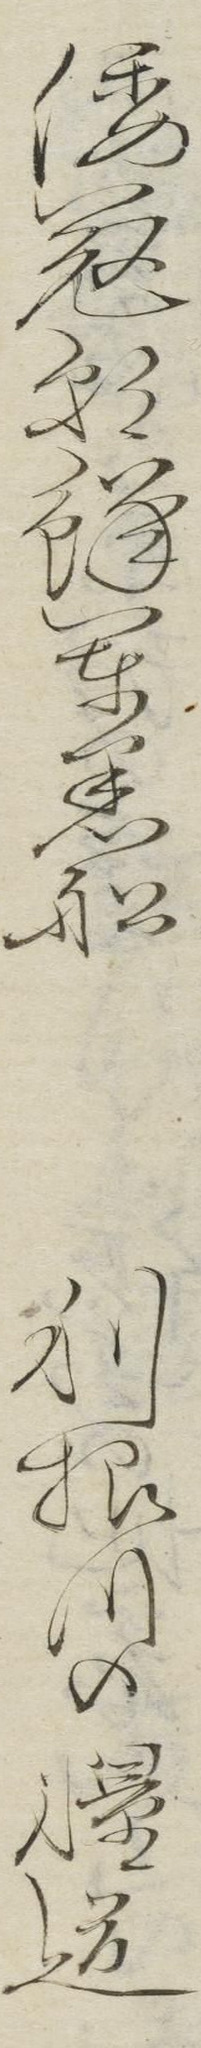倭寇願解軍黒船利根川の瀑道
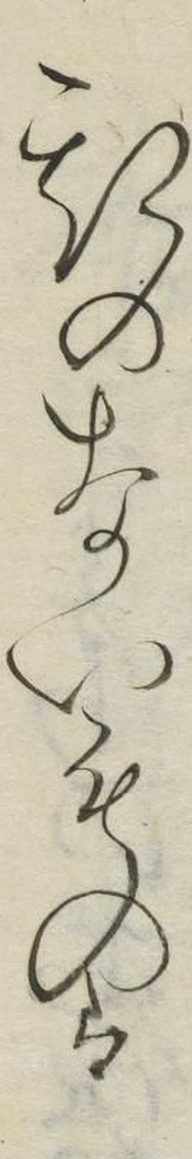期のないものは
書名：大地震實録
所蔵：東京大学地震研究所図書室 Earthquake Research Institute Library, The University of Tokyo, JAPAN
